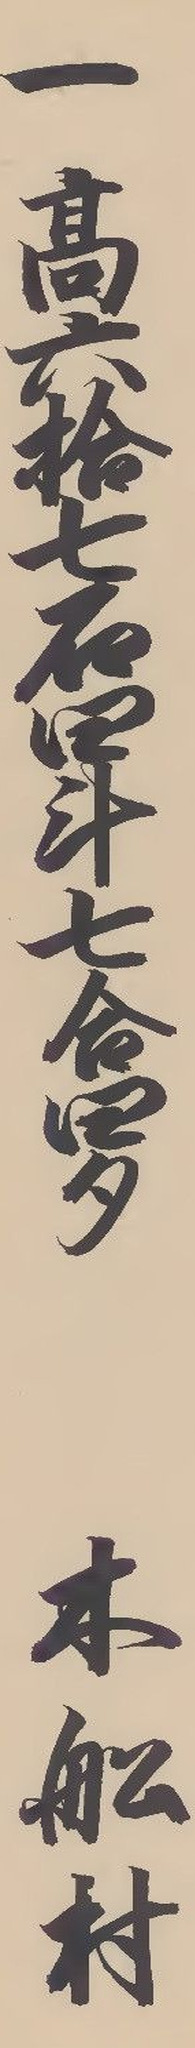一高六拾七石四斗七合四勺木船村

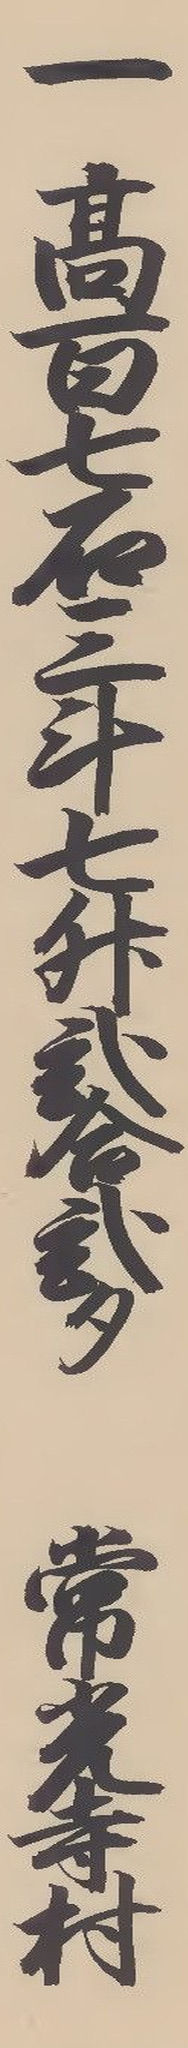一高百七石三斗七升弐合弐勺常光寺村
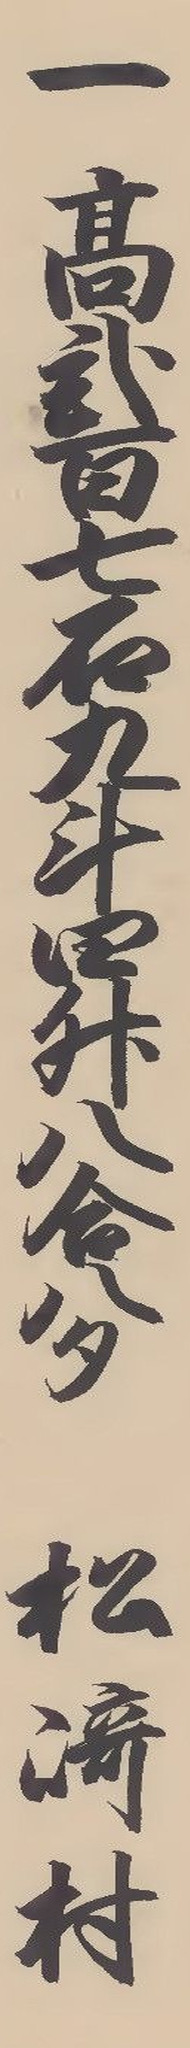一高弐百七石九斗四升八合八勺松崎村
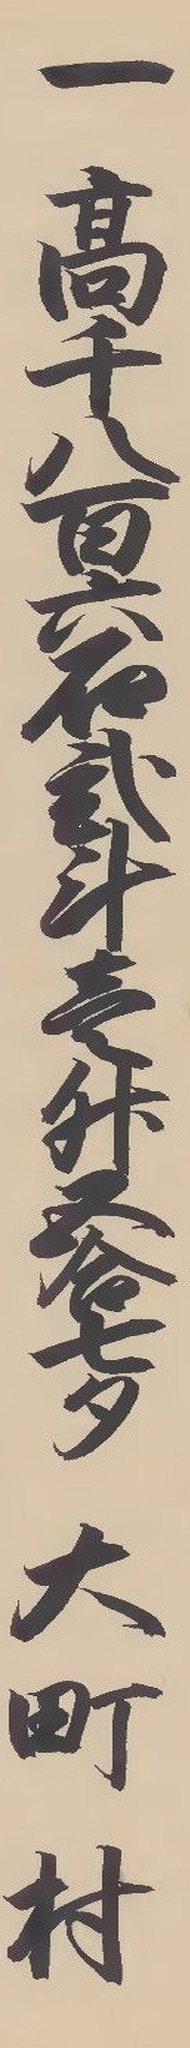一高千八百六石弐斗壱升五合七勺大町村
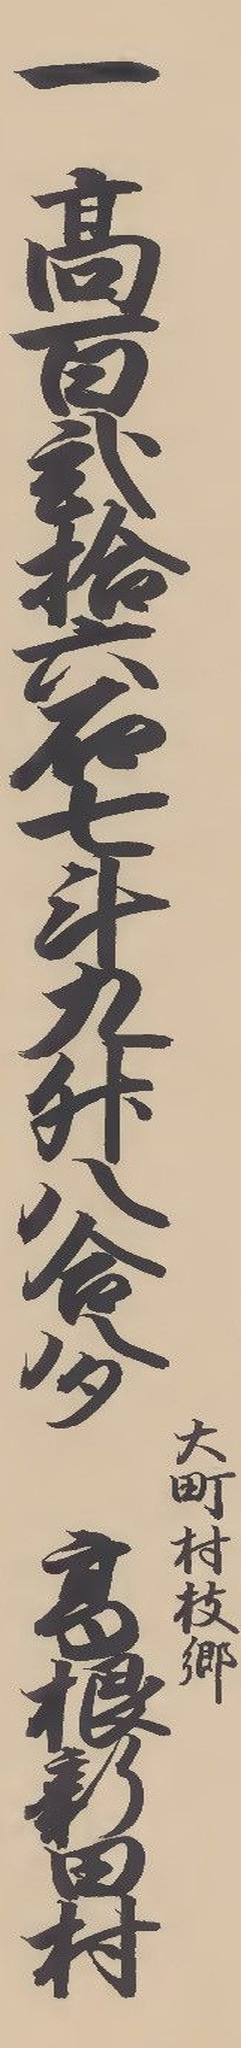一高百弐拾六石七斗九升八合八勺高根新田村
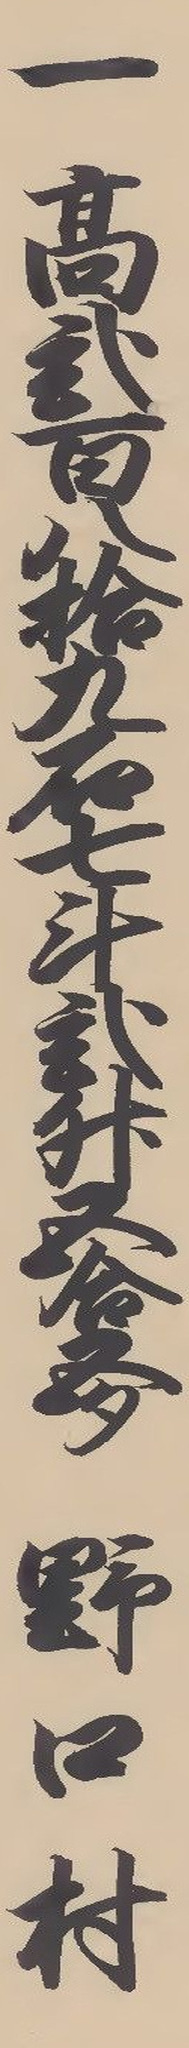一高弐百八拾九石七斗弐升五合五勺野口村

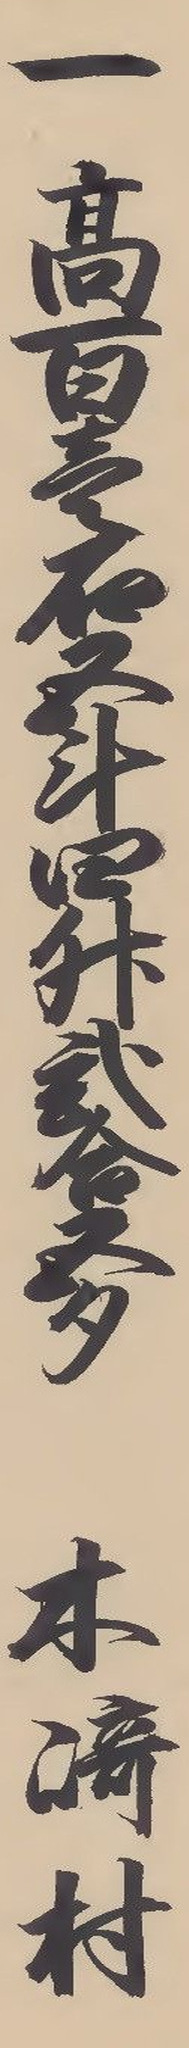一高百壱五斗四升弐合五勺木崎村
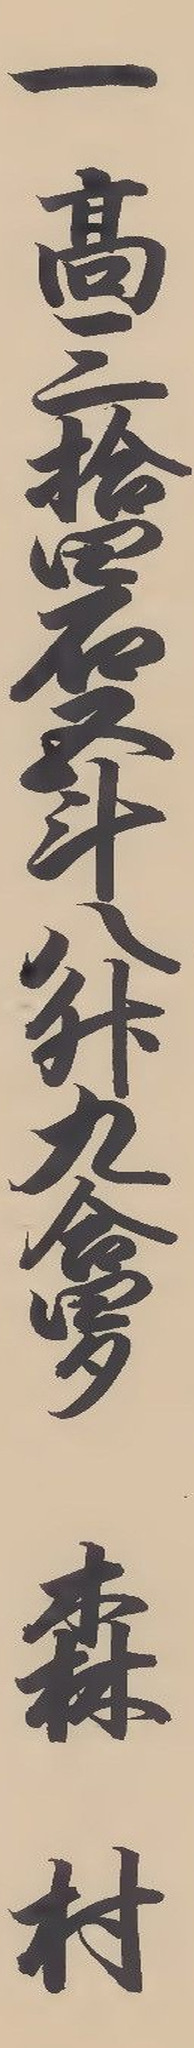一高三拾四石五斗八升九合四勺森村
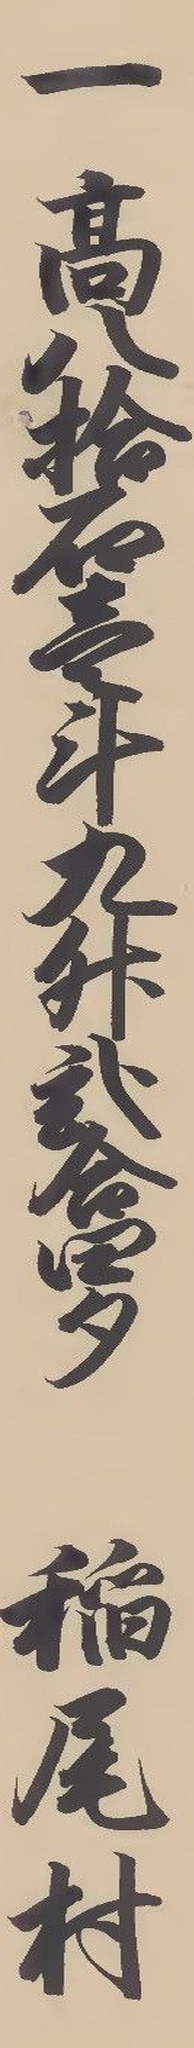一高八拾石壱斗九升弐合四勺稲尾村
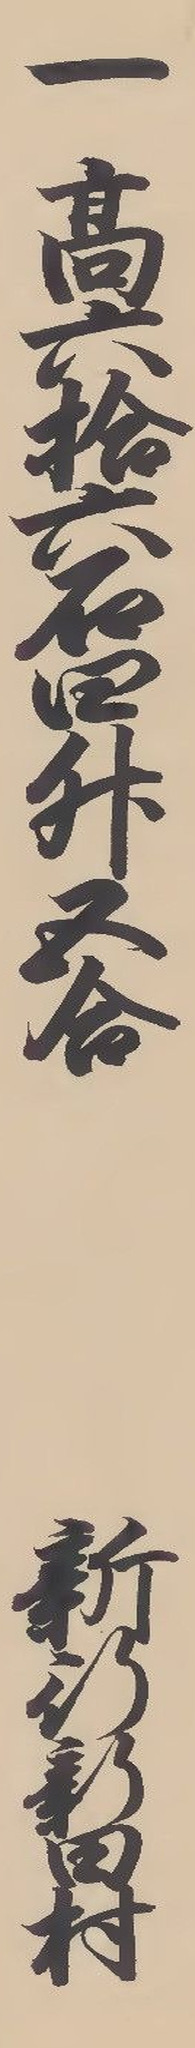一高六拾六石四升五合新行新田村
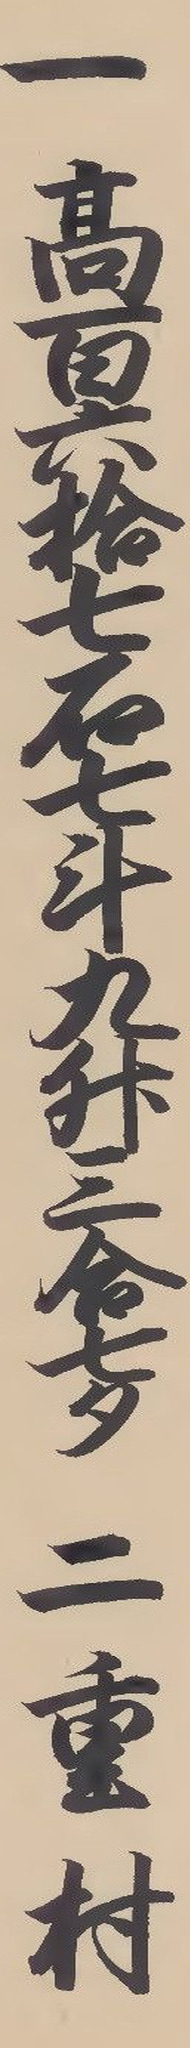一高百六拾七石七斗九升三合七勺二重村
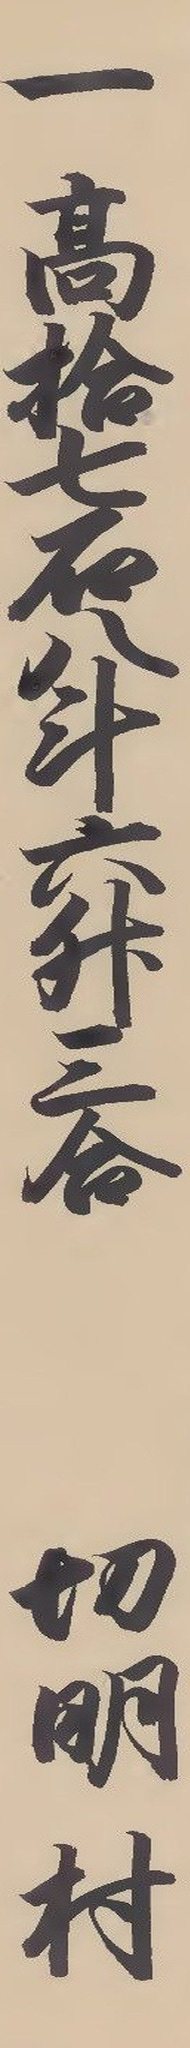一高拾七石八斗六升三合切明村
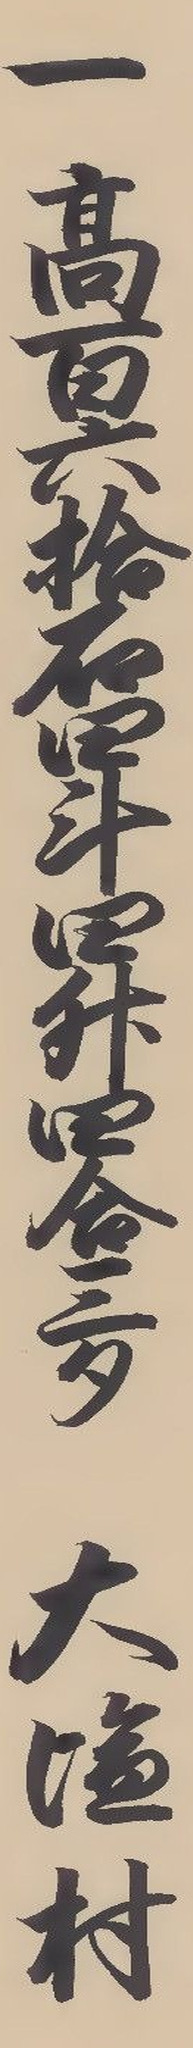一高百六拾石四斗四升四合三勺大塩村

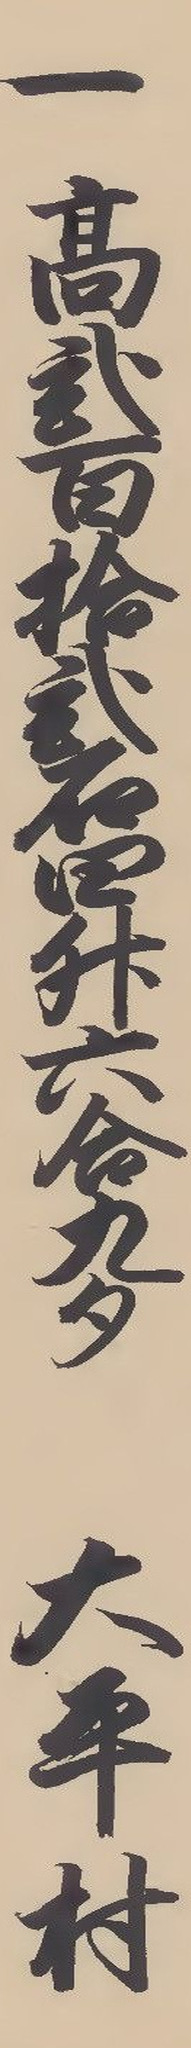一高弐百拾弐石四升六合九勺大平村
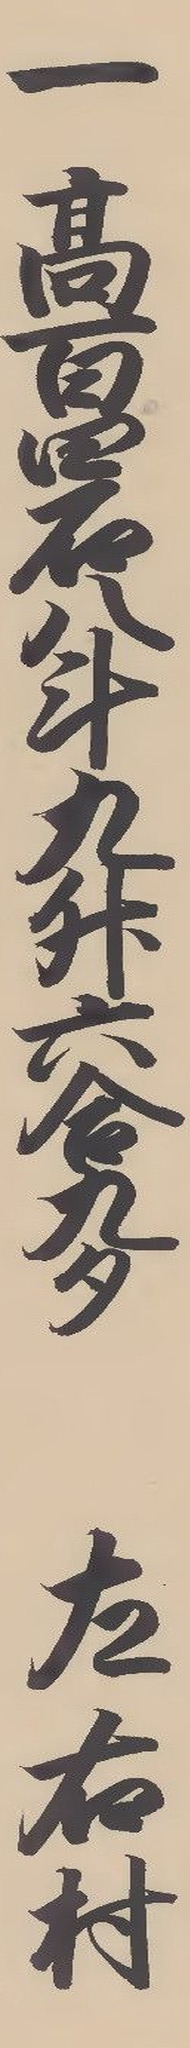一高百四石八斗九升六合九勺左右村
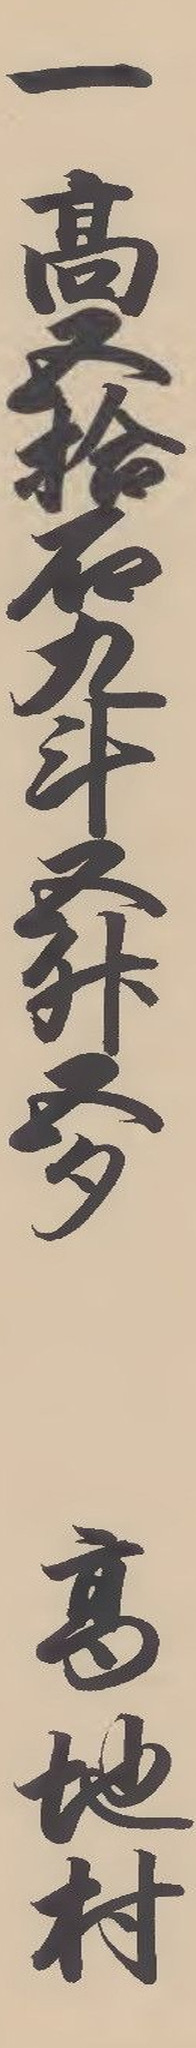一高五拾石九斗五升五勺高地村
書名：信濃国郷帳
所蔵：国立公文書館 National Archives of Japan
